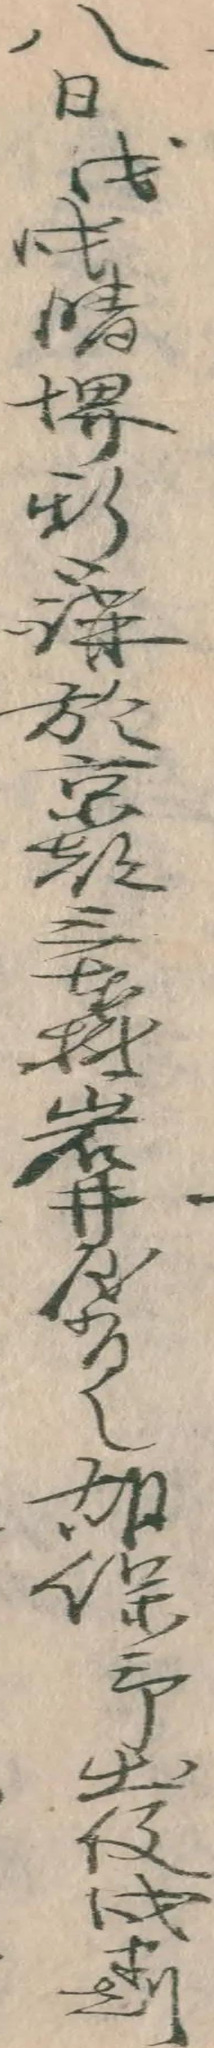八日戊戌晴堺新御講於京都三本松岩井屋有之胡保予出役戌半刻
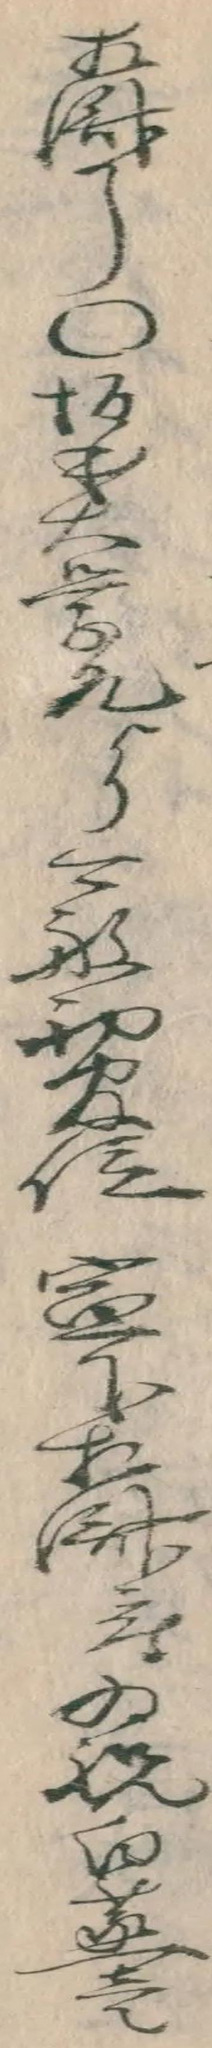相済了○坂東大學允より今般初官位宣下相済ニ付為祝白蒸壱
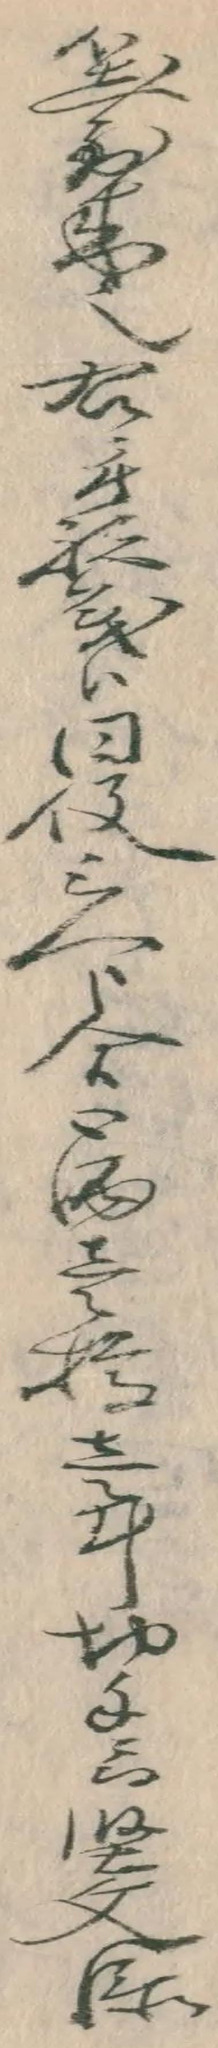蒸到来之右ニ付祝義御同役三人申合御酒壱樽壱斗切手ニ而堅又添
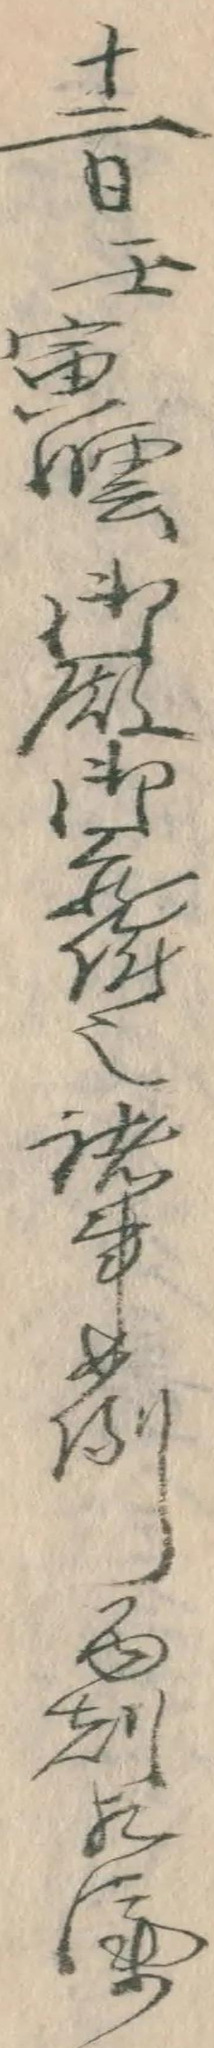十二日壬寅曇御殿御蔵附也諸事如例酉刻相済
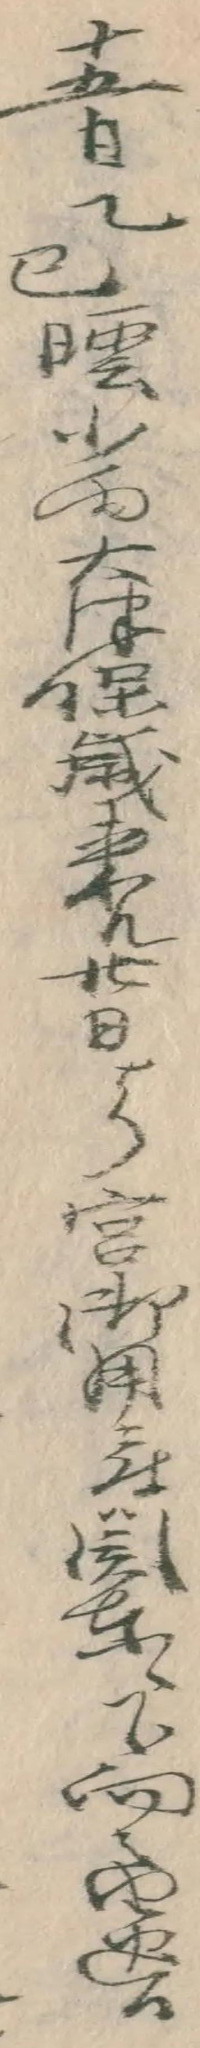十五日乙巳曇小雨大津保歳来ル廿日より宮御用ニ付関東へ下向之由過日
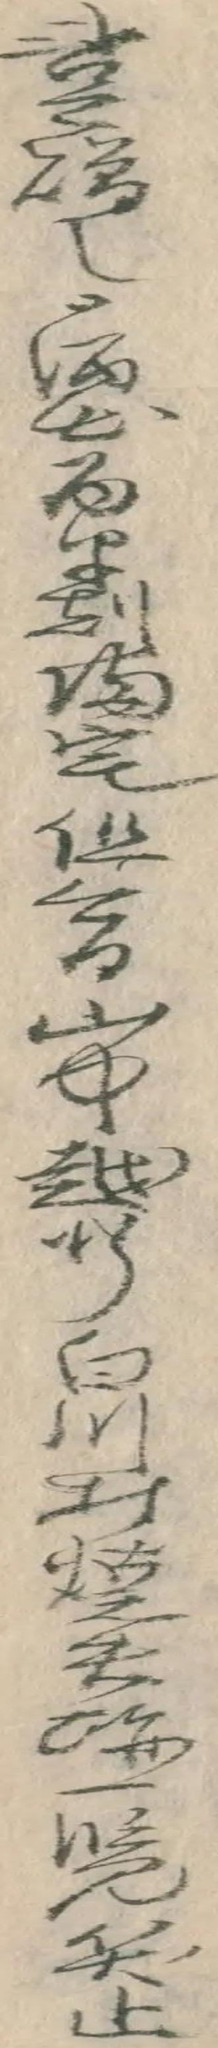弐足贈也御酒御酒出酉半刻帰宅但今日山中越行白川村焼失跡一覧笑止

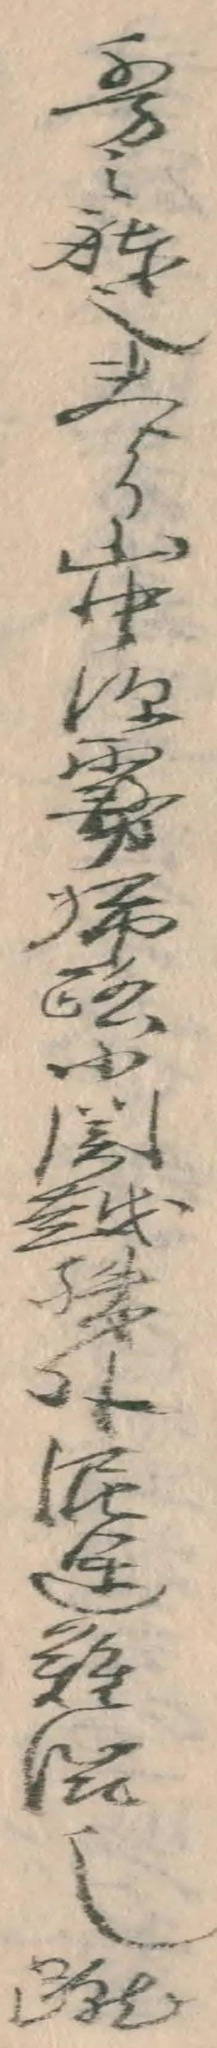両方之躰也夫より山中源霧帰路小関越殊外泥途難渋也蹴
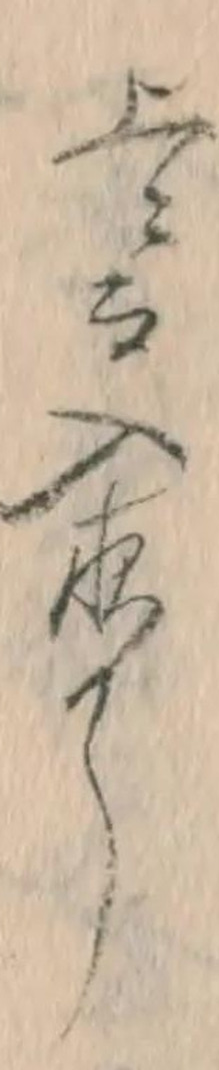上ニ而入夜了
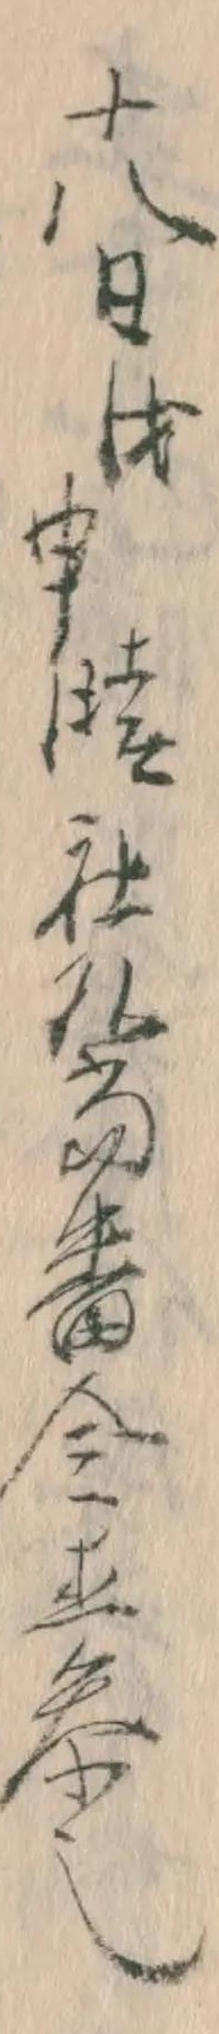十八日戊申晴社頭當番令直参也
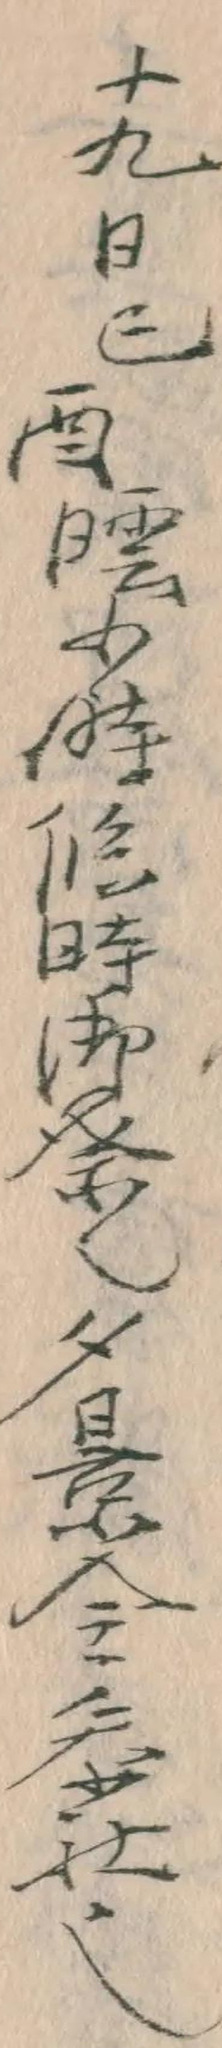十九日己酉曇少時臨時御祭也夕景令参社也
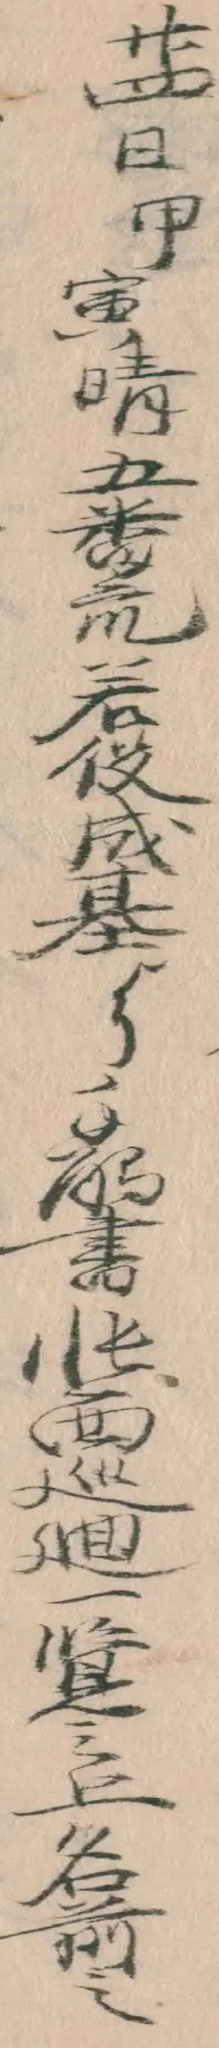廿四日甲寅晴五番衆若役成基より千触書帳面巡廻一覧之上名前之
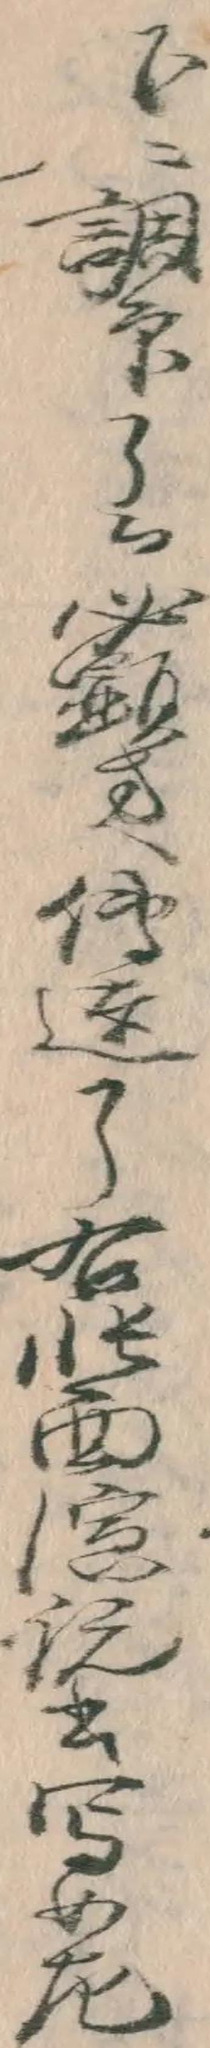下ニ調印了而必顕方へ傳達了右帳面演説書写如左
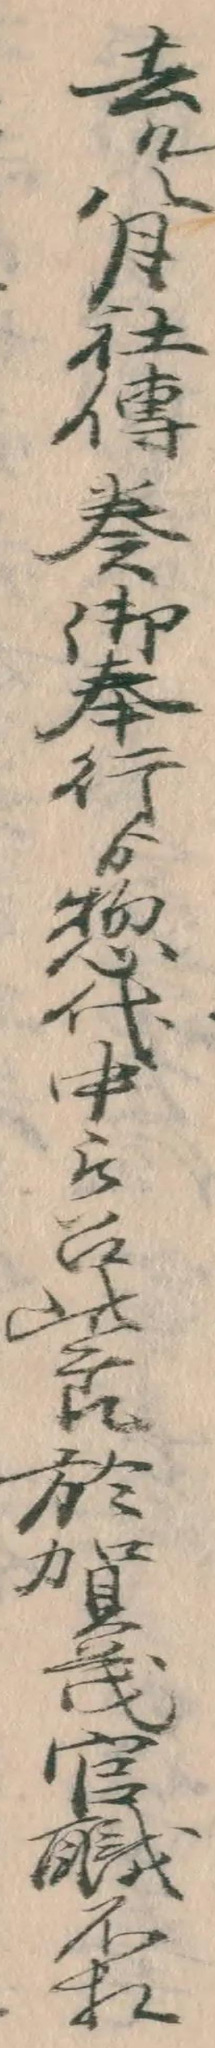去ル八月社傳奏御奉行ゟ惣代中被召此節於賀茂官職不相
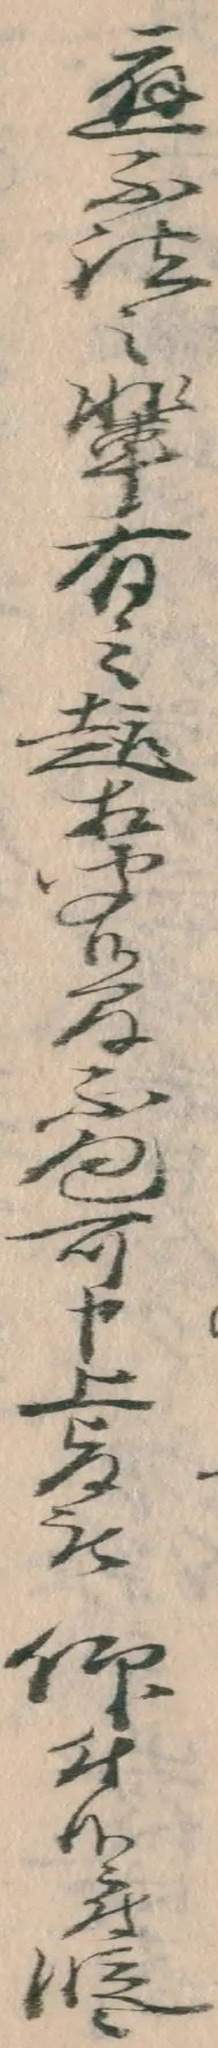應不法之輩有之趣相聞候間不包可申上旨被仰付候ニ付段々
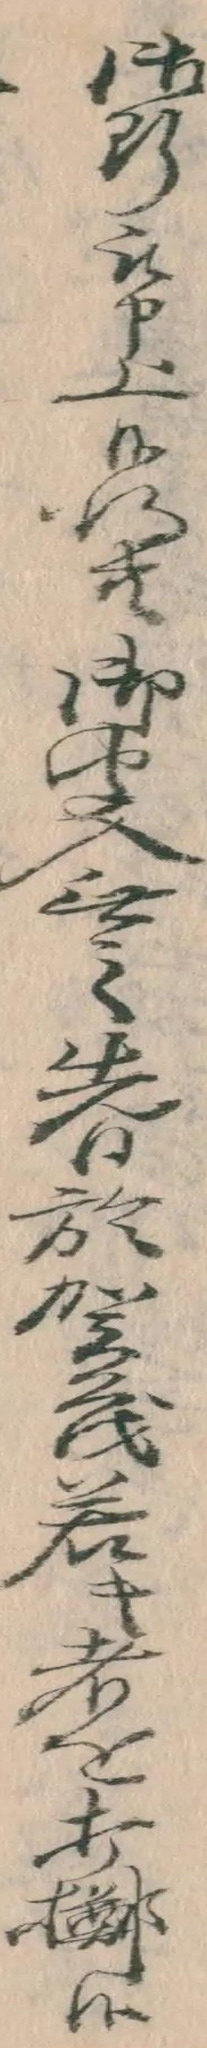御断被申上候得共御聞入無之先日於賀茂若キ者を打擲候
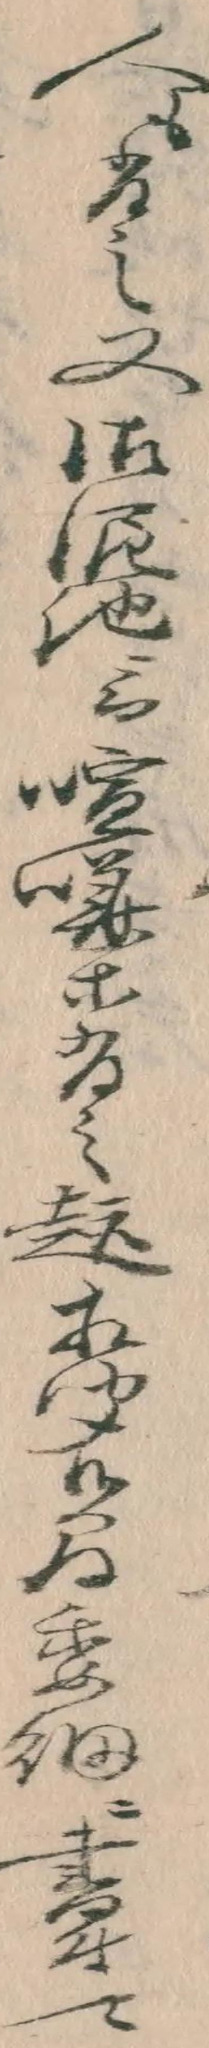人も有之又御泥池ニ而喧嘩等有之趣相聞候間委細ニ書付可
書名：賀茂社記録. 第65冊
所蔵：国立国会図書館 National Diet Library, JAPAN
